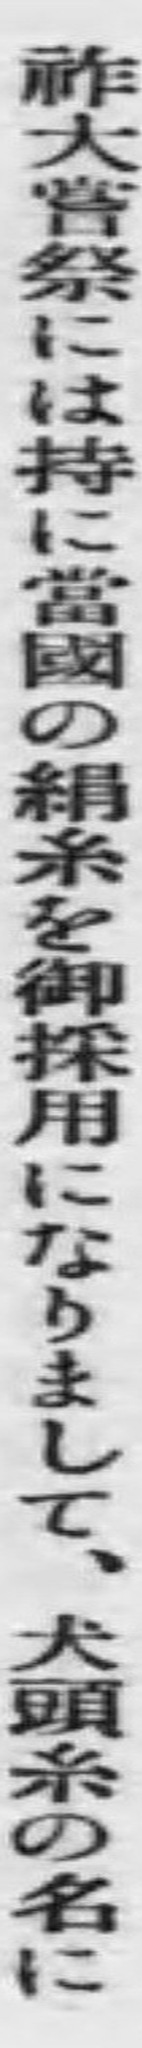祚大嘗祭には持に当国の絹糸を御採用になりまして、犬頭糸の名に
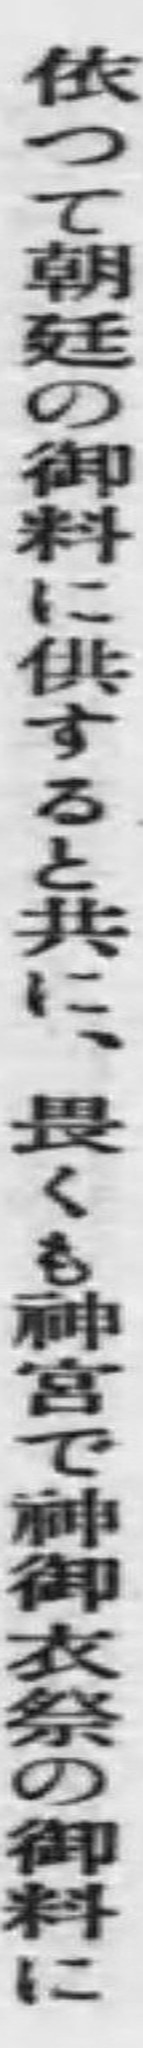依つて朝廷の御料に供すると共に、畏くも神宮で神御衣祭の御料に
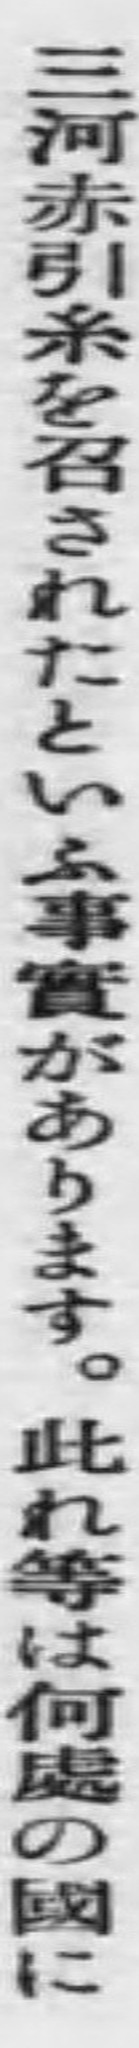三河赤引糸を召されたといふ事実があります。此れ等は何処の国に
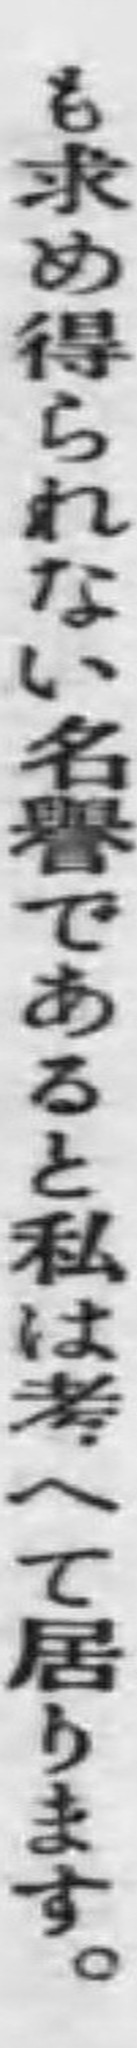も求め得られない名誉であると私は考へて居ります。
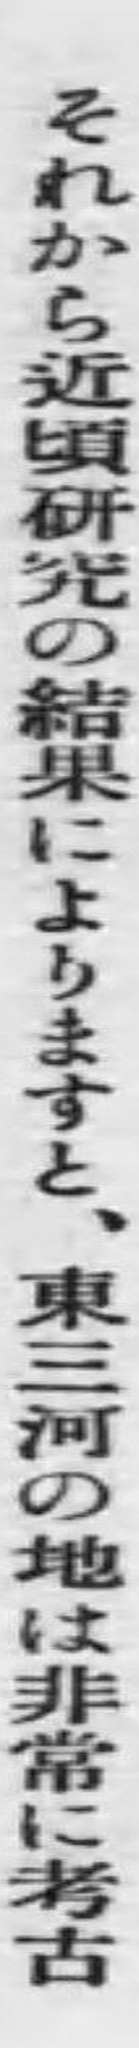それから近頃研究の結果によりますと、東三河の地は非常に考古
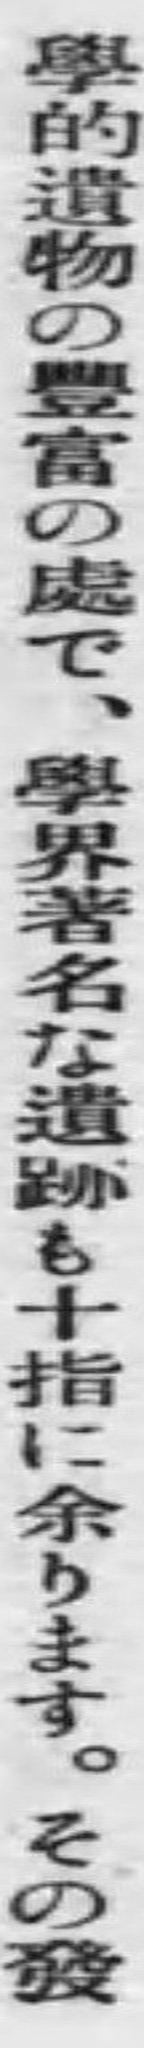学的遺物の豊富の処で、学界著名な遺跡も十指に余ります。その発
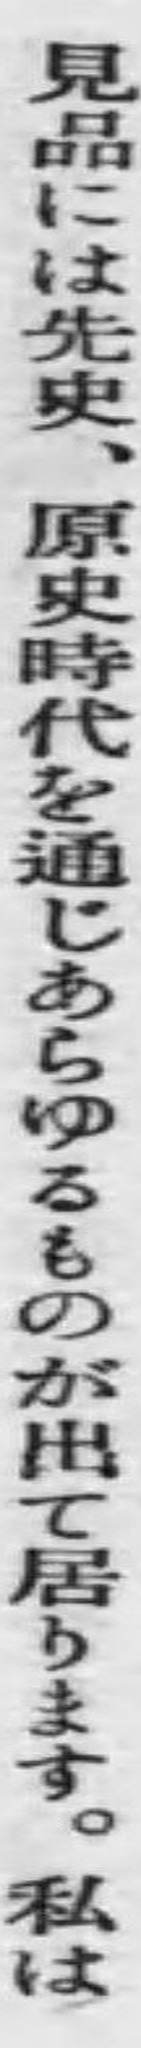見品には先史、原史時代を通じあらゆるものが出て居ります。私は
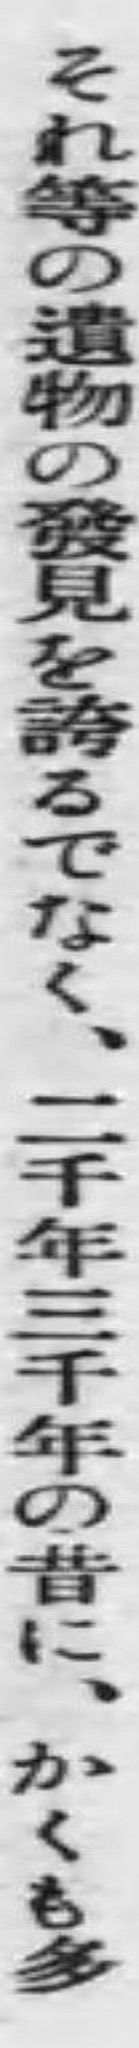それ等の遺物の発見を誇るでなく、二千年三千年の昔に、かくも多
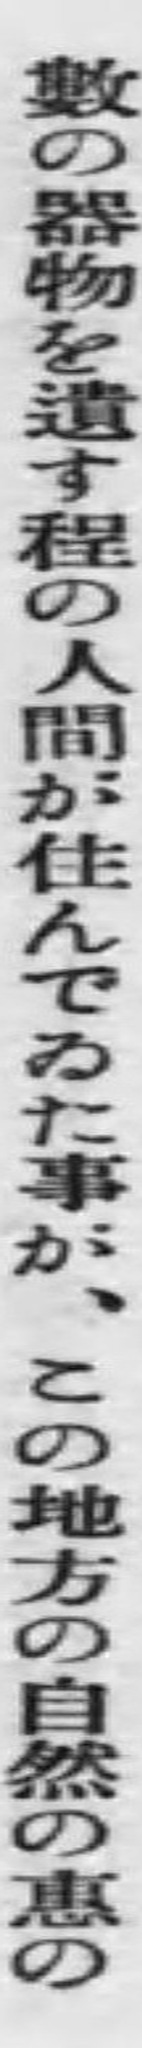数の器物を遺す程の人間が住んでゐた事が、この地方の自然の恵の
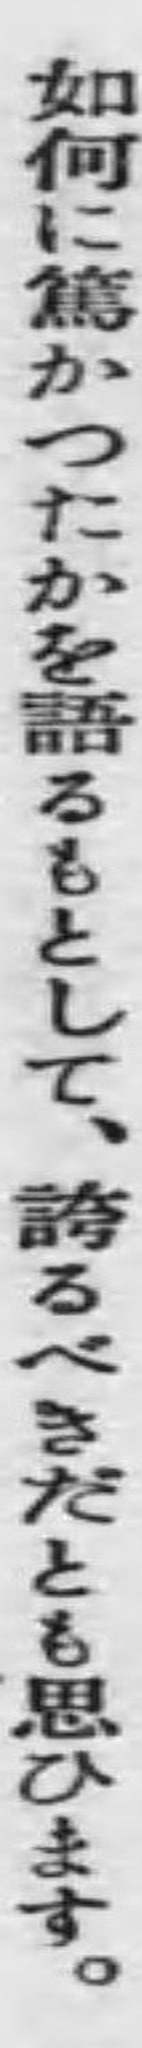如何に篤かつたかを語るもとして、誇るべきだとも思ひます。
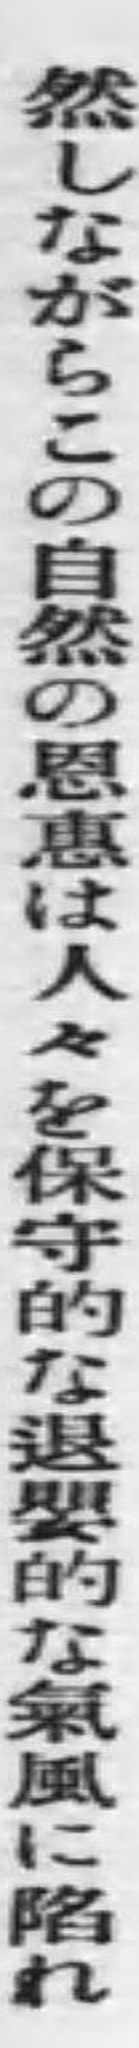然しながらこの自然の恩恵は人々を保守的な退嬰的な気風に陥れ
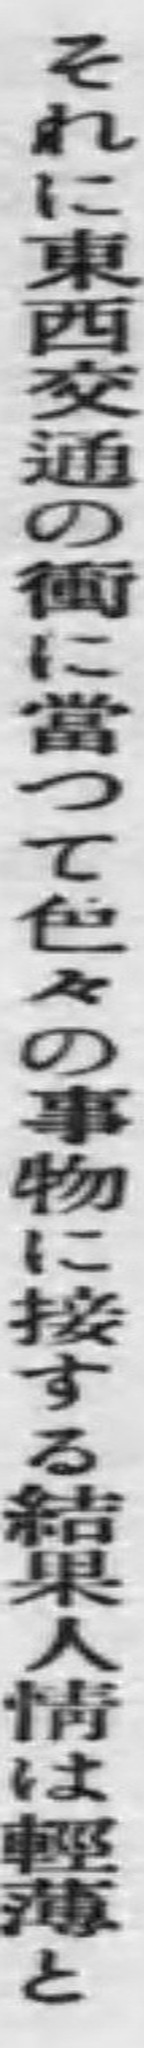それに東西交通の衝に当つて色々の事物に接する結果人情は軽薄と
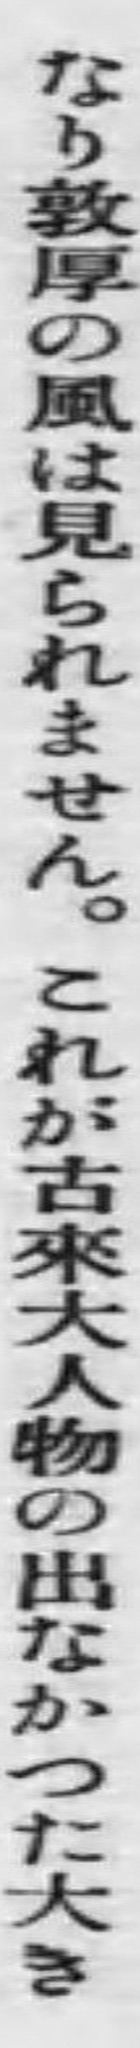なり敦厚の風は見られません。これが古来大人物の出なかつた大き
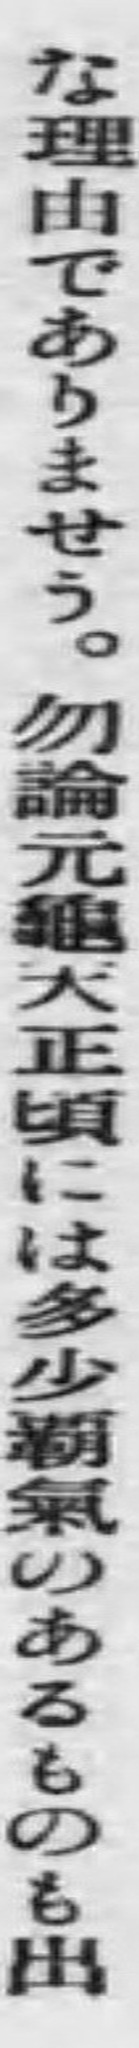な理由でありませう。勿論元亀天正頃には多少覇気のあるものも出
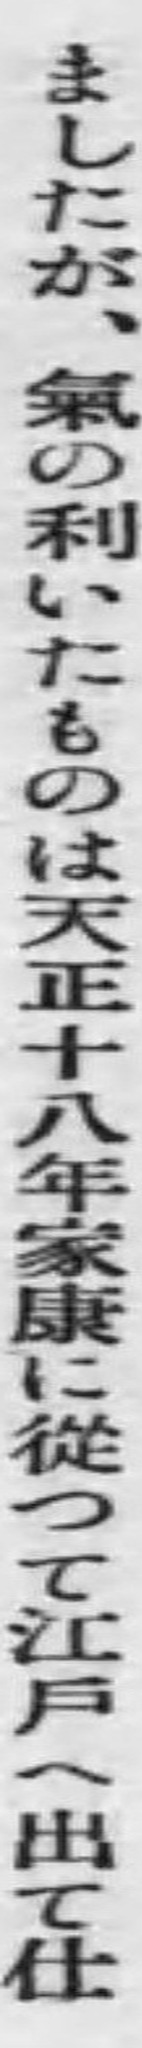ましたが、気の利いたものは天正十八年家康に従つて江戸へ出て仕
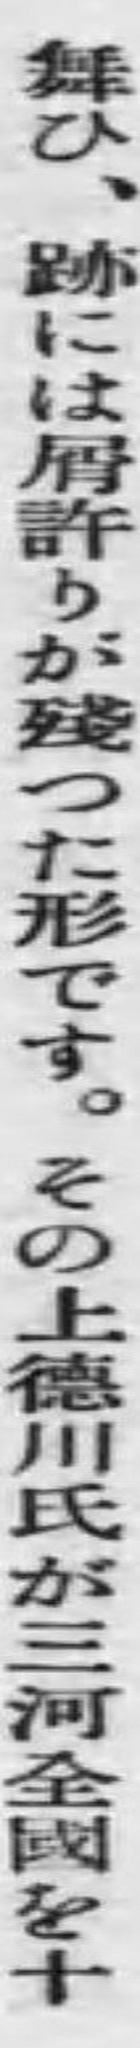舞ひ、跡には屑許りが残つた形です。その上徳川氏が三河全国を十
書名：東三河道中記 : 豊橋市及其附近案内
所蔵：国立国会図書館 National Diet Library, JAPAN
